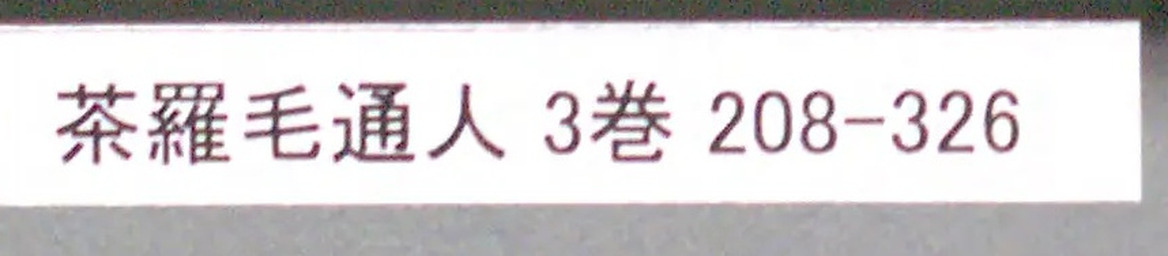茶羅毛通人完

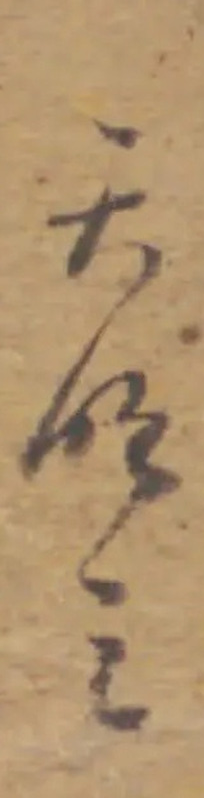天明三

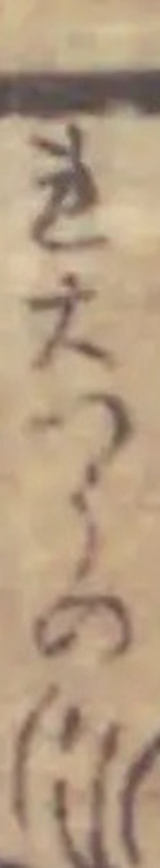れ大つうの
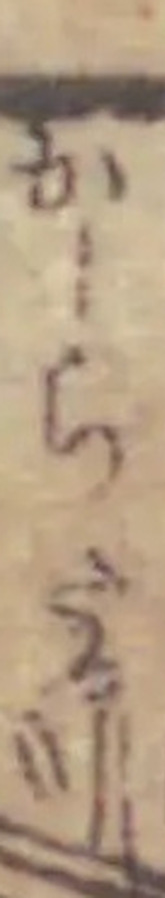かしらたる
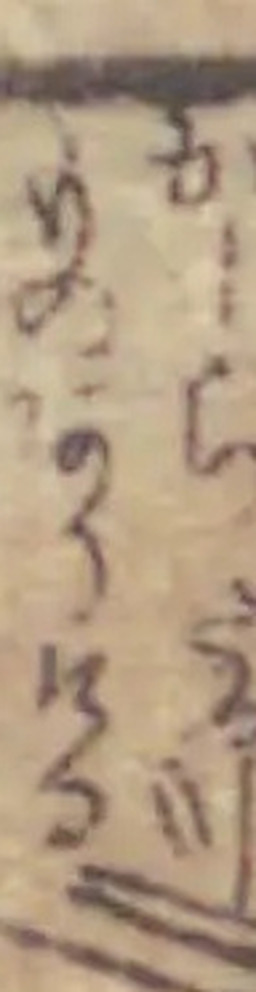ものありける
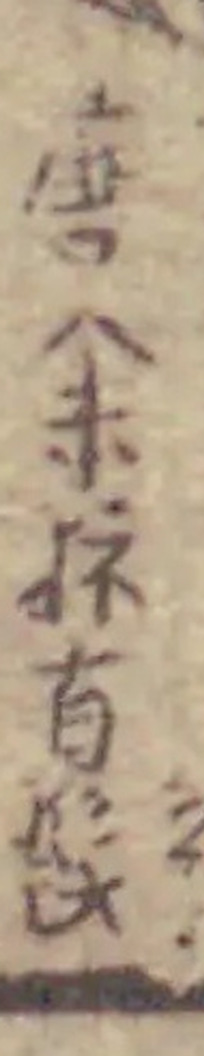唐人未抔有髭
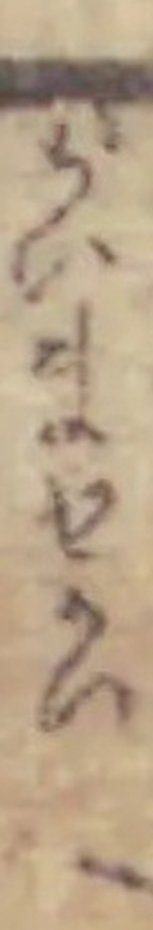かいませかい
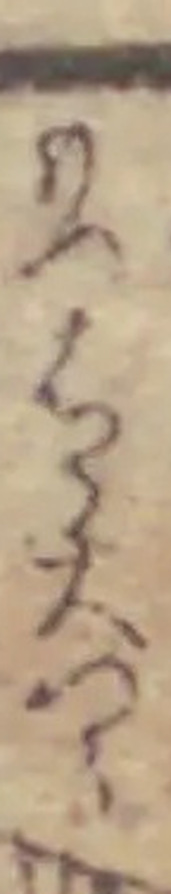もつはら大つう
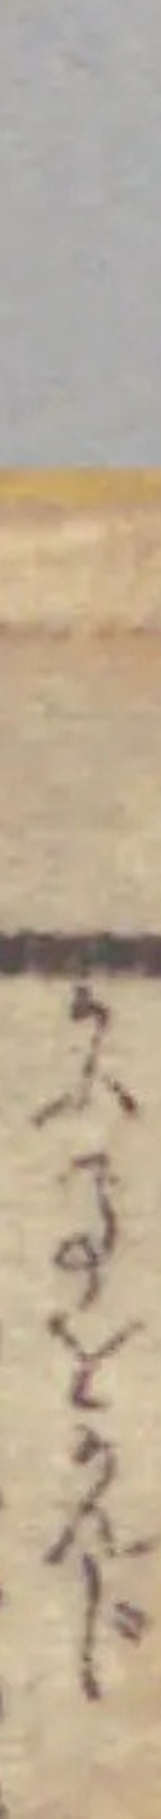かふ事をかんじ
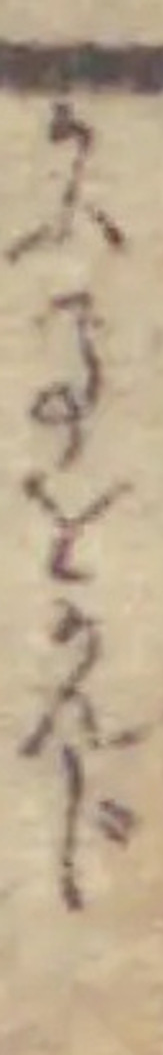かふ事をかんじ
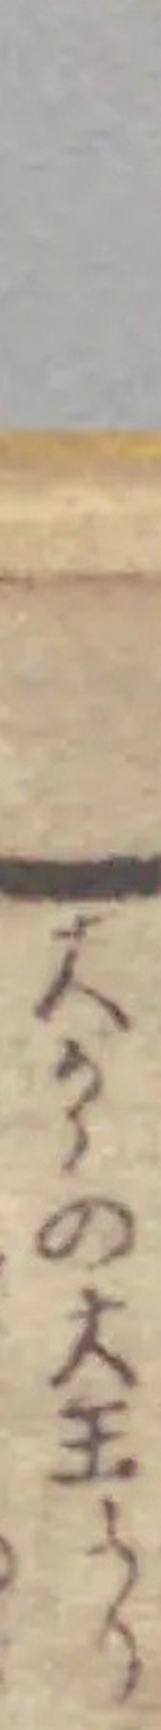大からの大王より
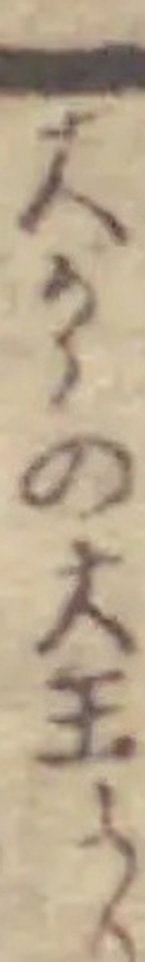大からの大王より
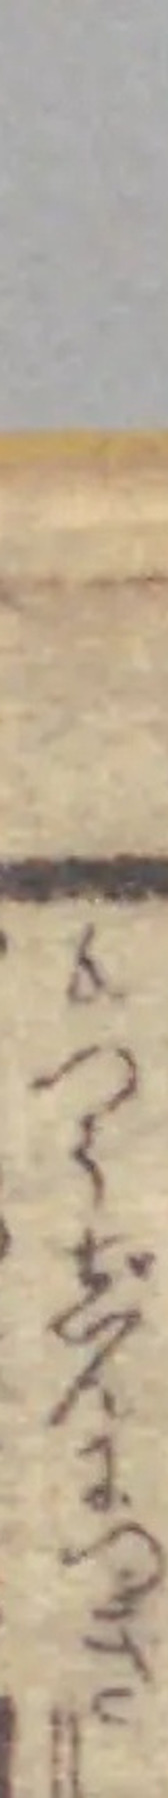もつうじんにつき
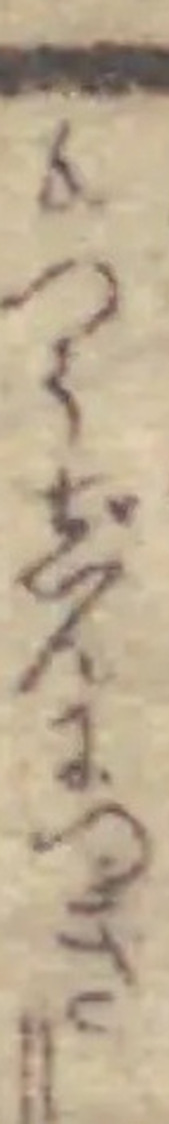もつうじんにつき
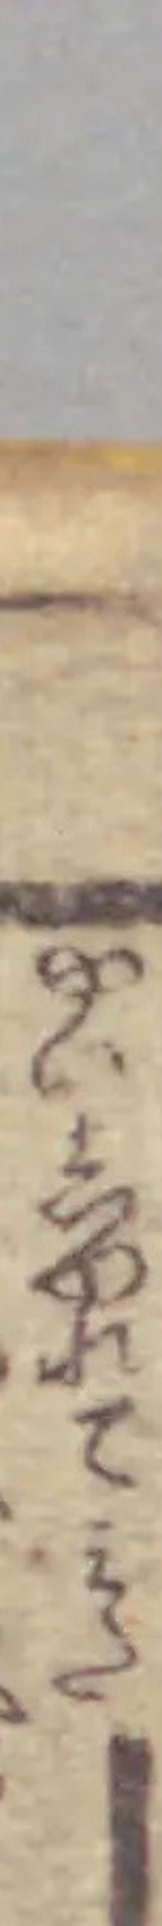やいしやれてみた
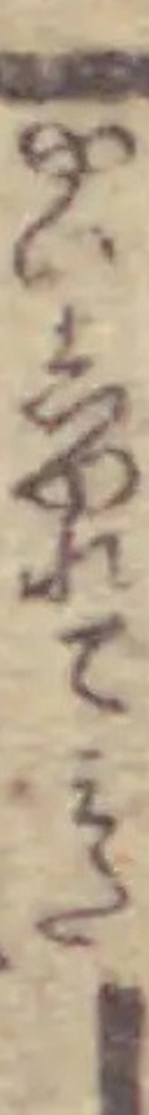やいしやれてみた
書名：茶羅毛通人 3巻
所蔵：国立国会図書館 National Diet Library, JAPAN
